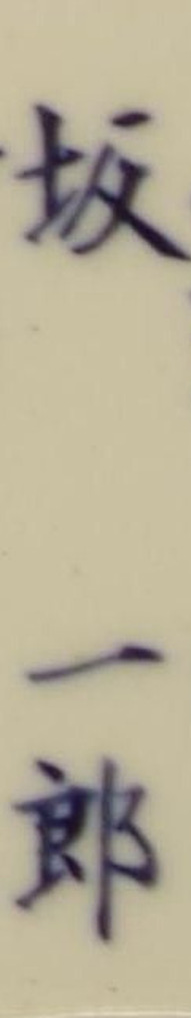坂一郎
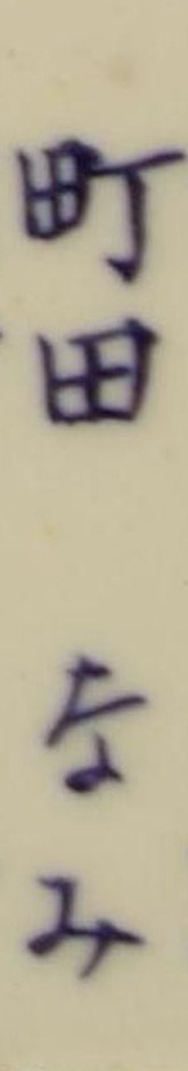町田なみ
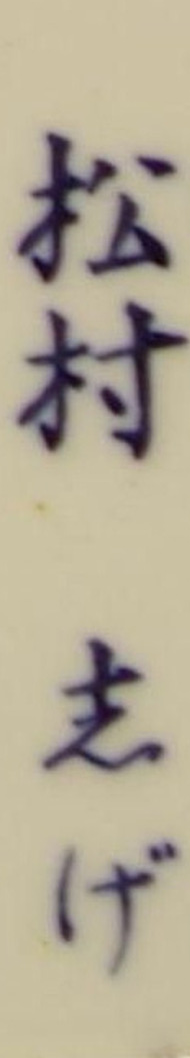松村しげ
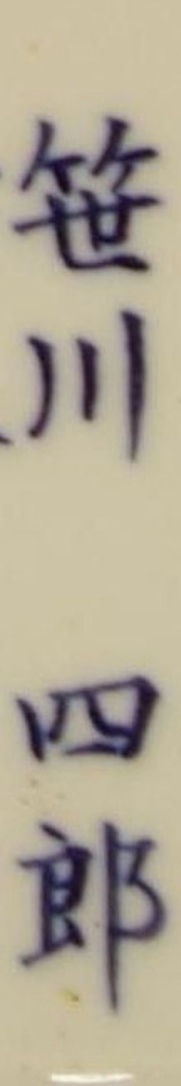笹川四郎
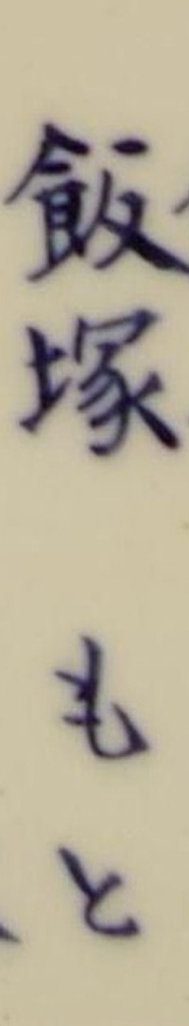飯塚もと
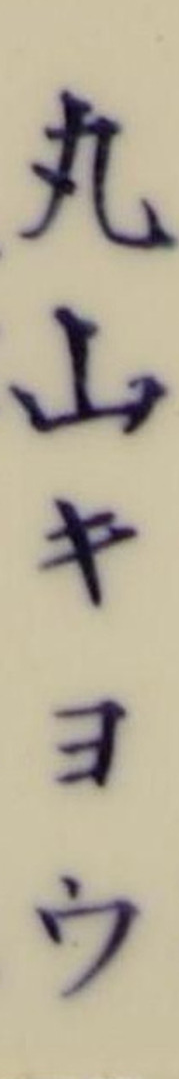丸山キヨウ
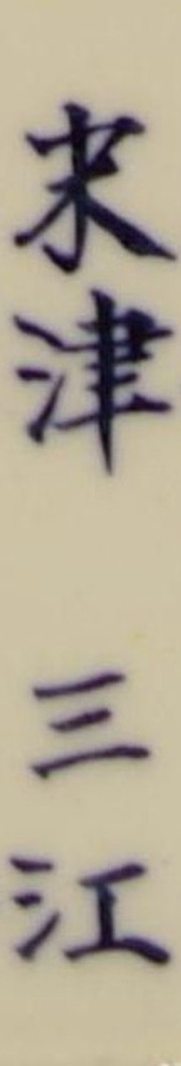米津三江
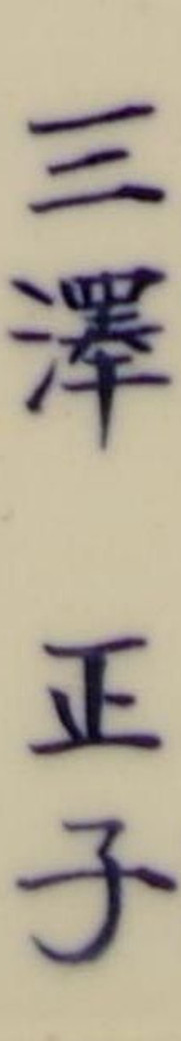三澤正子
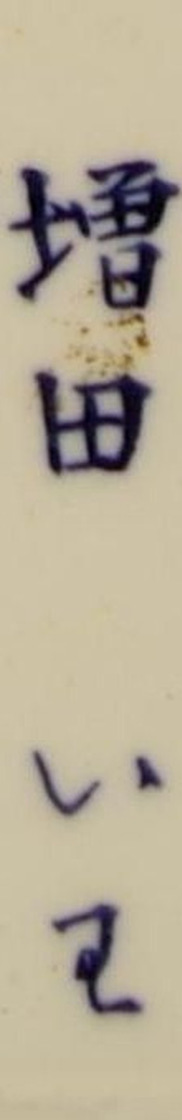増田いわ
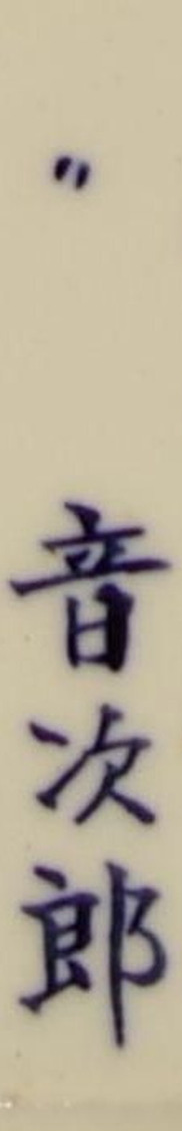音次郎
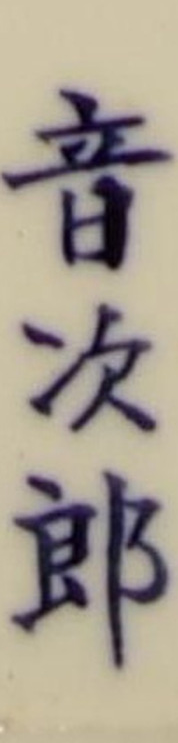音次郎
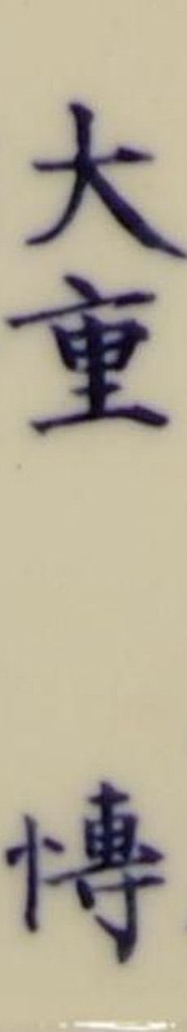大重博
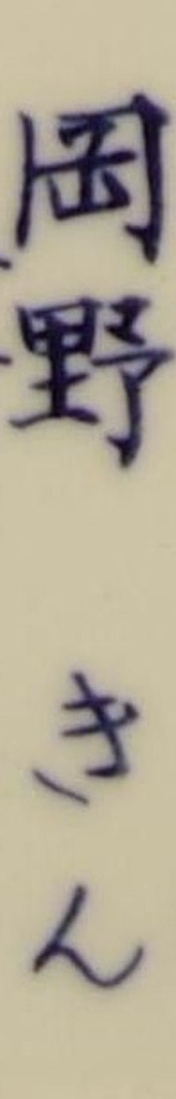岡野きん
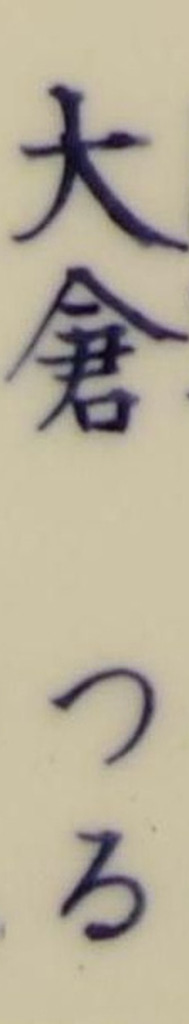大倉つる
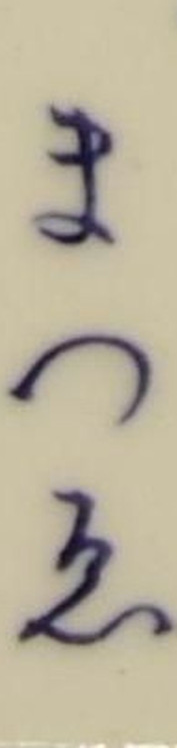まつえ
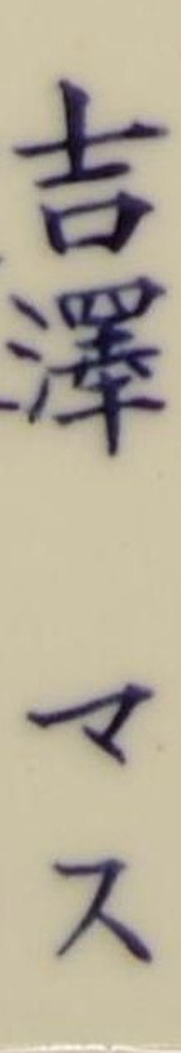吉澤マス
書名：E~L
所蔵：高野山金剛峯寺
